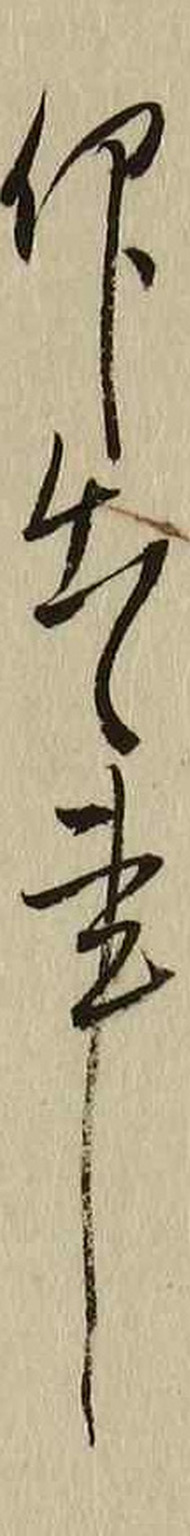仰出候事
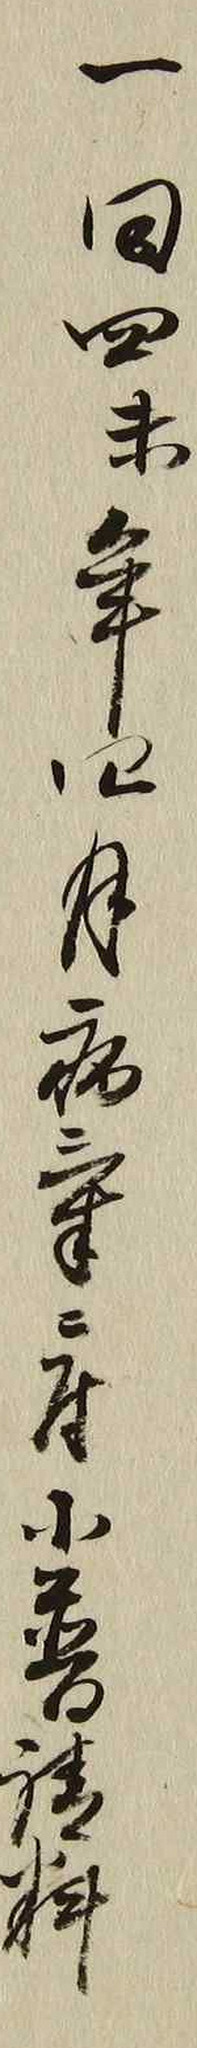一同四未年四月病気ニ付小普請料
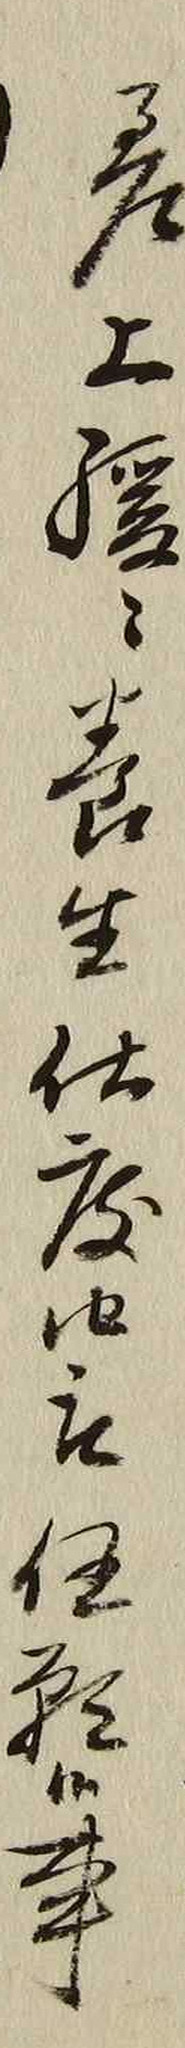差上緩々養生仕度由被任願候事
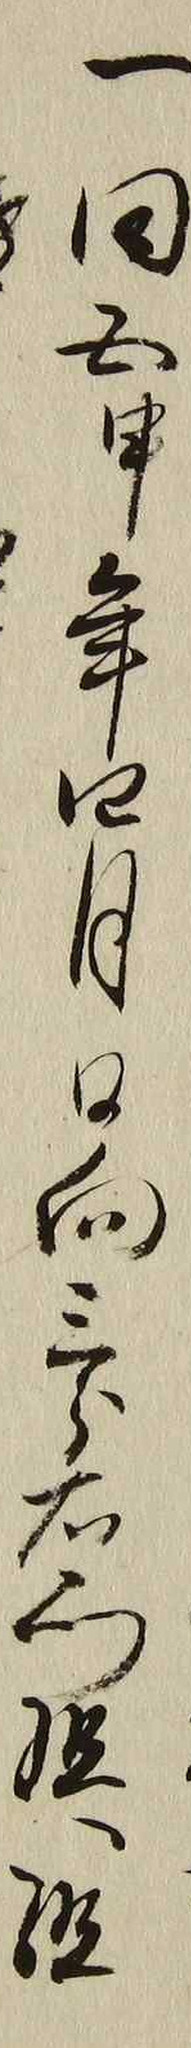一同五申年四月日向三郎右衛門組へ組
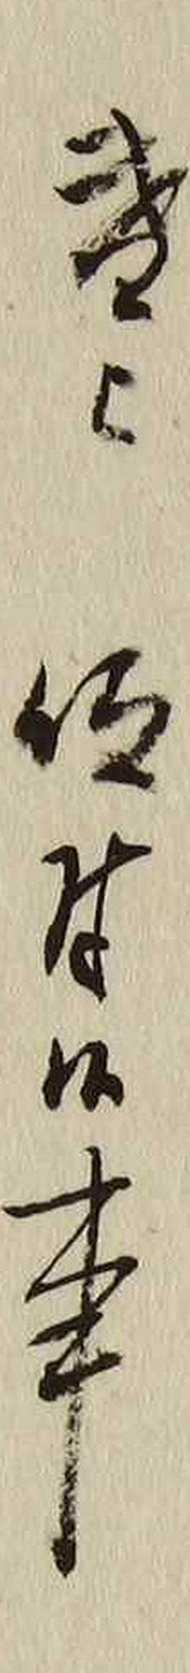替被仰付候事
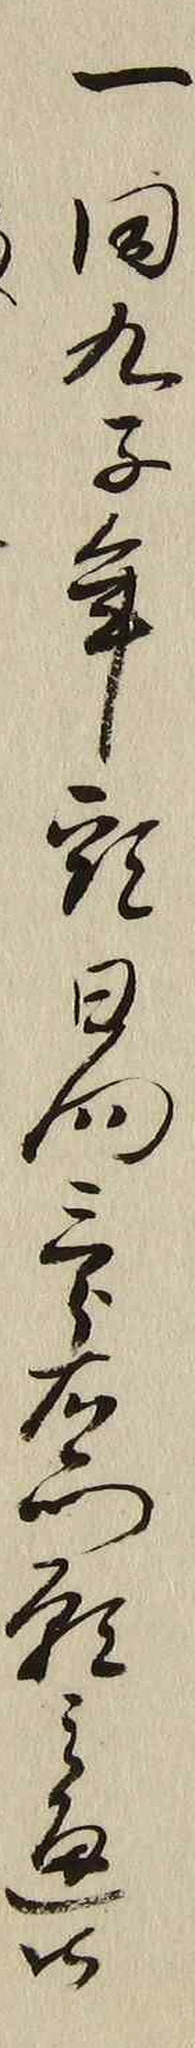一同九子年頭日向三郎右衛門願之通御
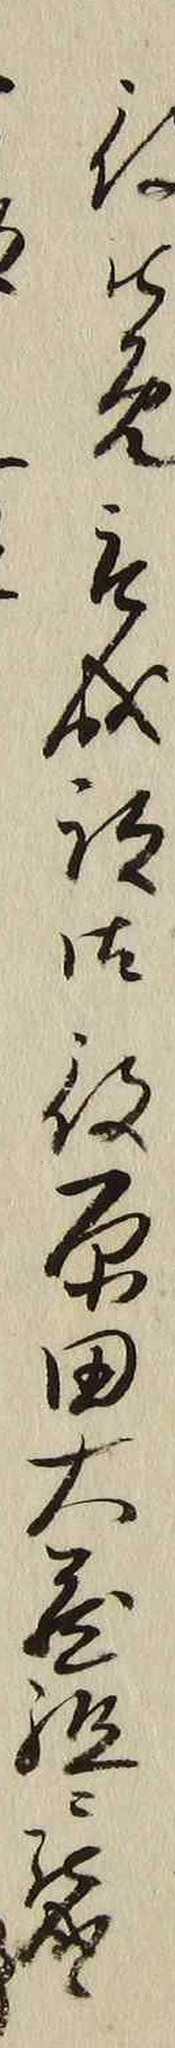役御免被成跡御役原田大蔵組ニ罷成候事
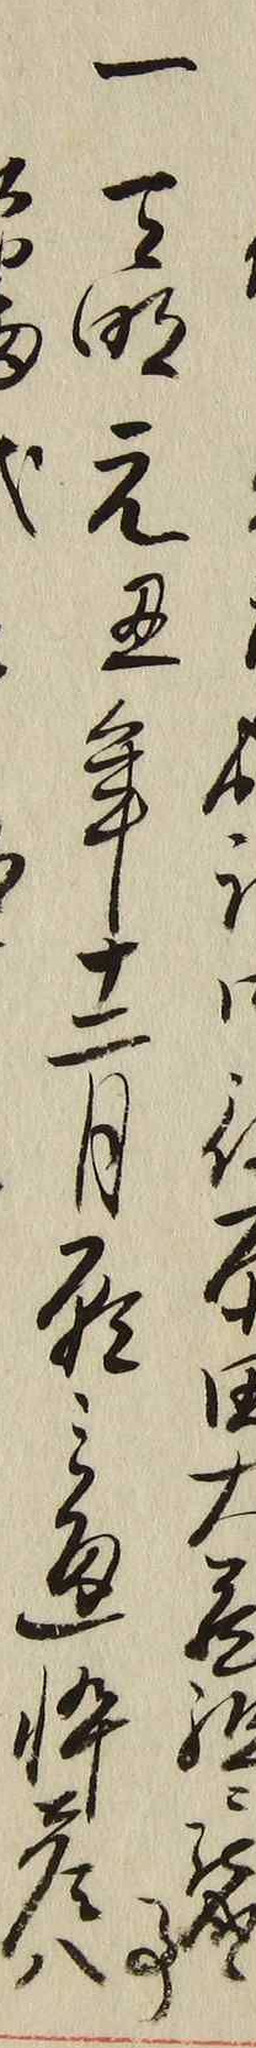一天明元丑年十二月願之通忰彦八
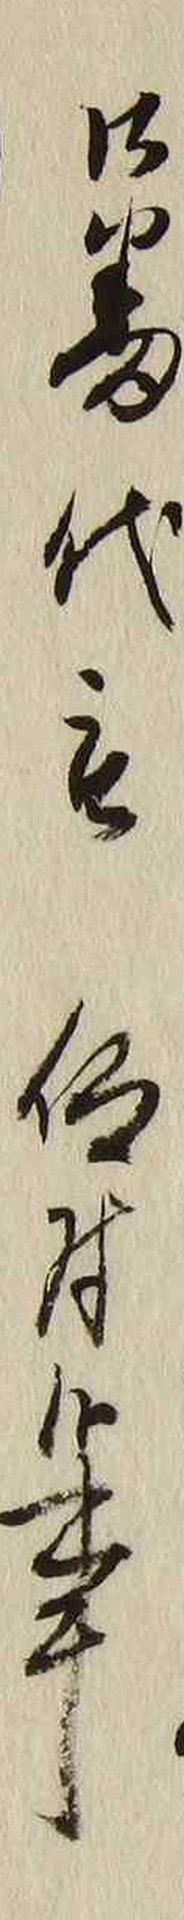御番代被仰付候事
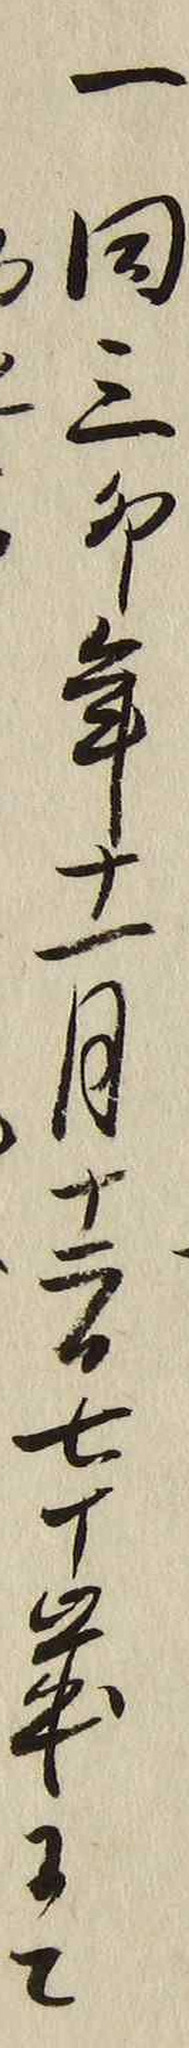一同三卯年十一月十二日七十歳にて
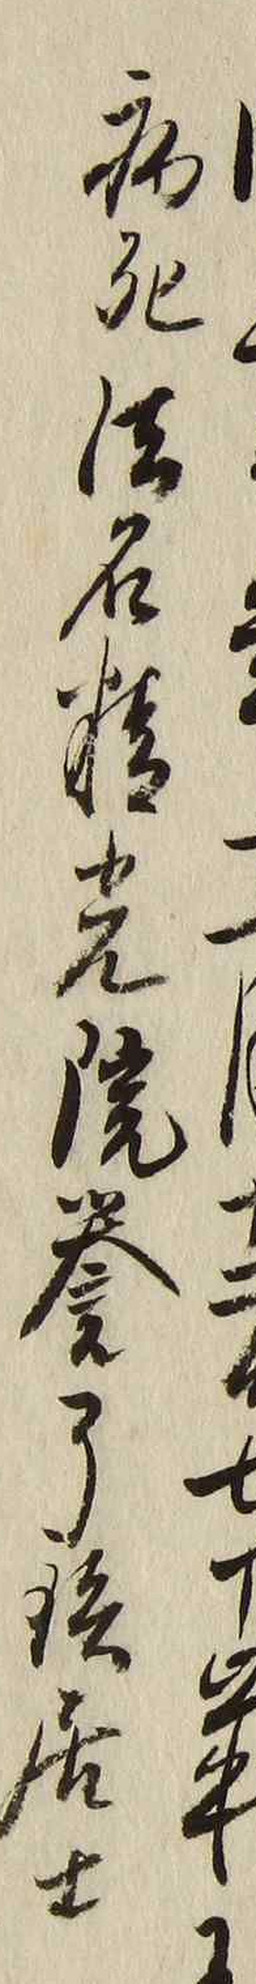病死法名精光院誉了鉄居士

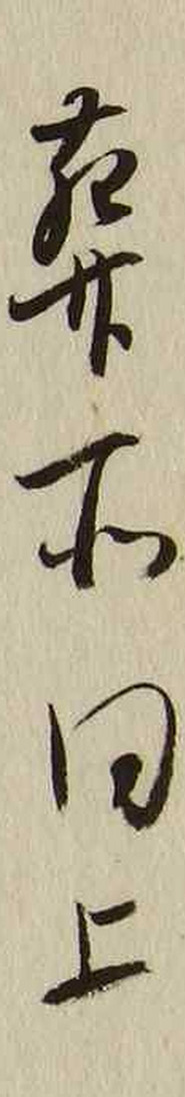葬所同上
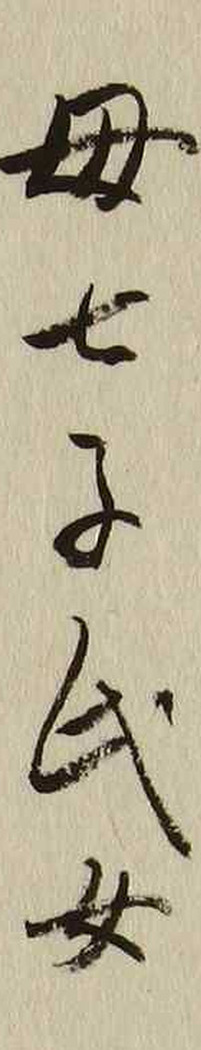母七子氏女
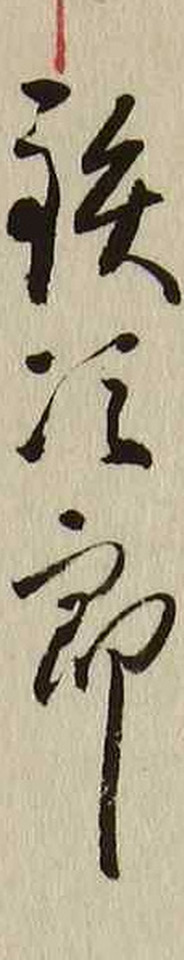鉄次郎
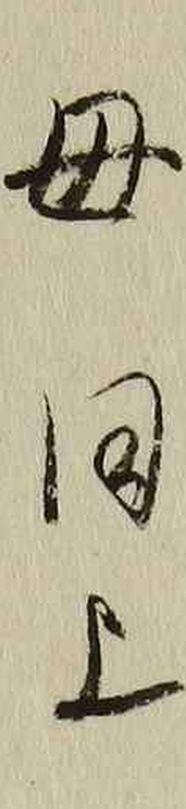母同上
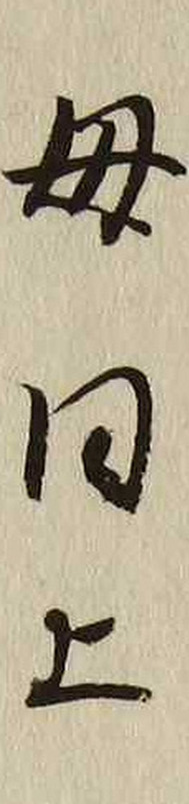母同上
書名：諸士系譜　巻之348　も之部4
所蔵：会津若松市立会津図書館
